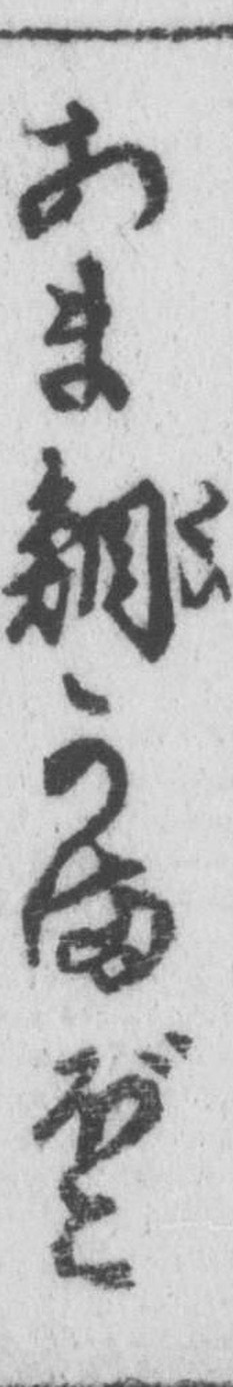あま鯛かまぼこ
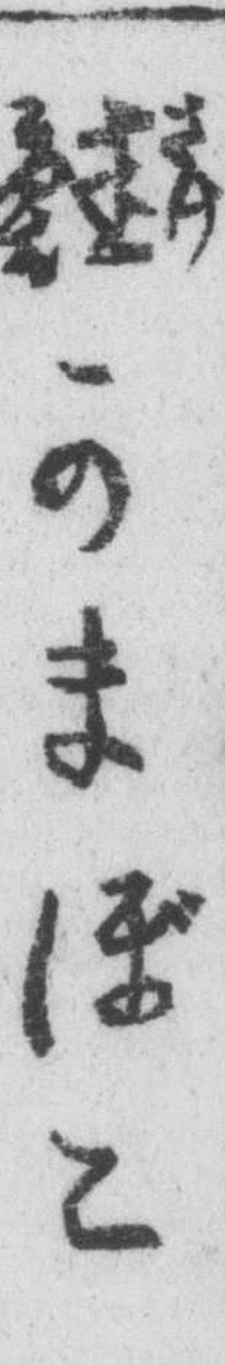鰆かまぼこ
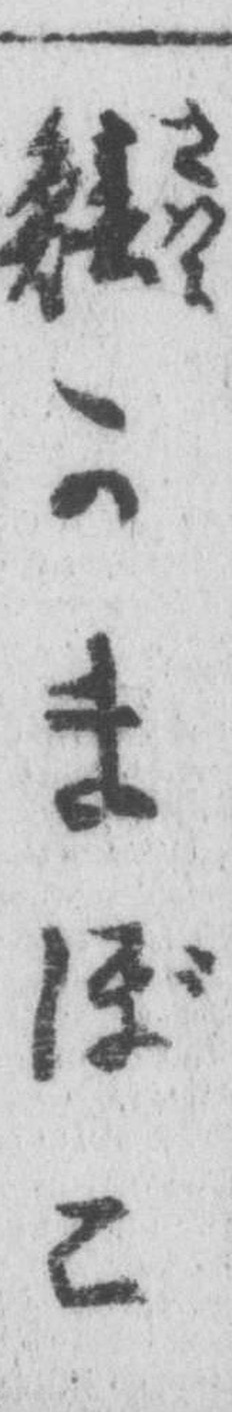鰆かまぼこ
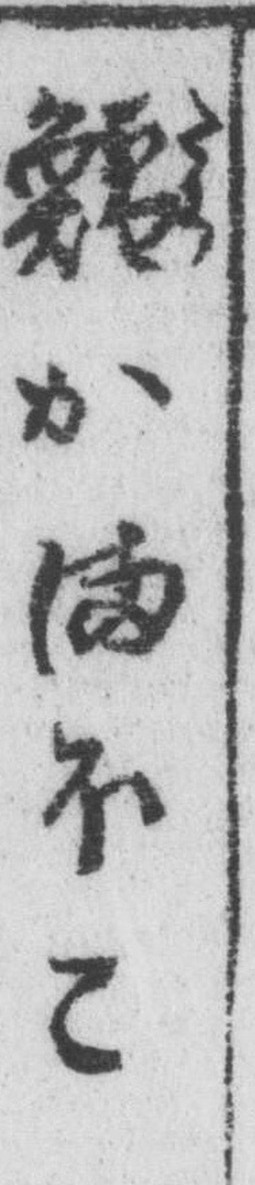鰆かまぼこ
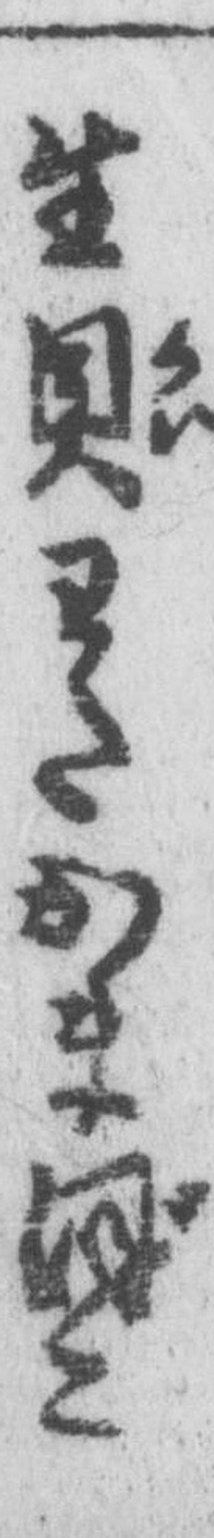生貝わたかまぼこ
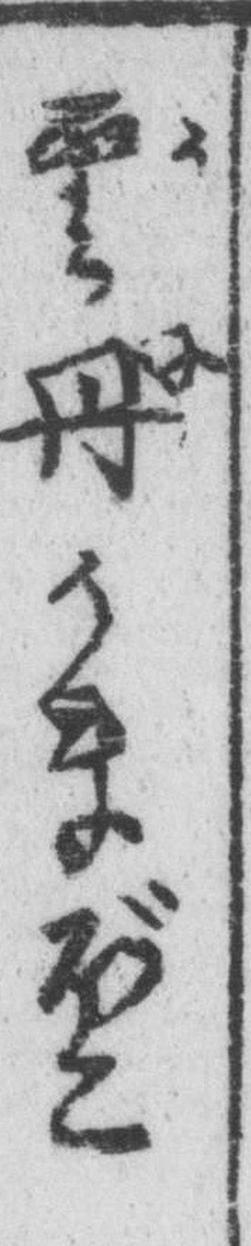鰆かまぼこ
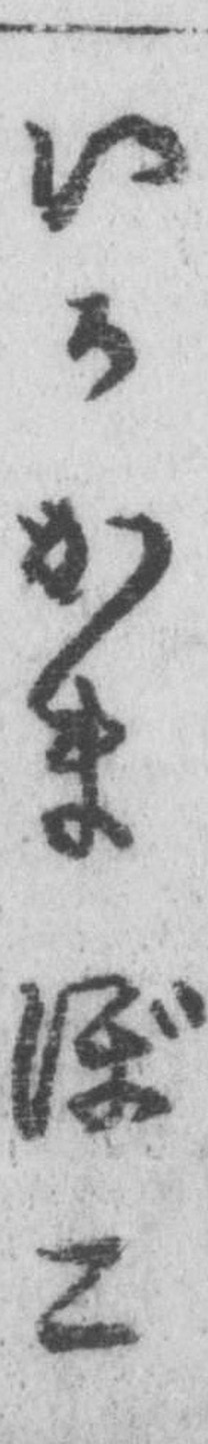いかかまぼこ
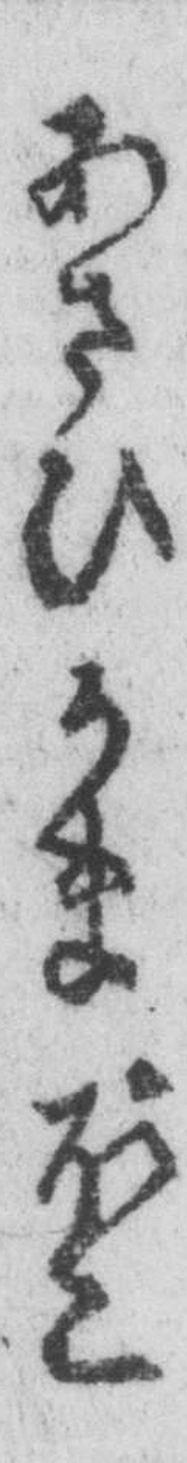あま鯛かまぼこ
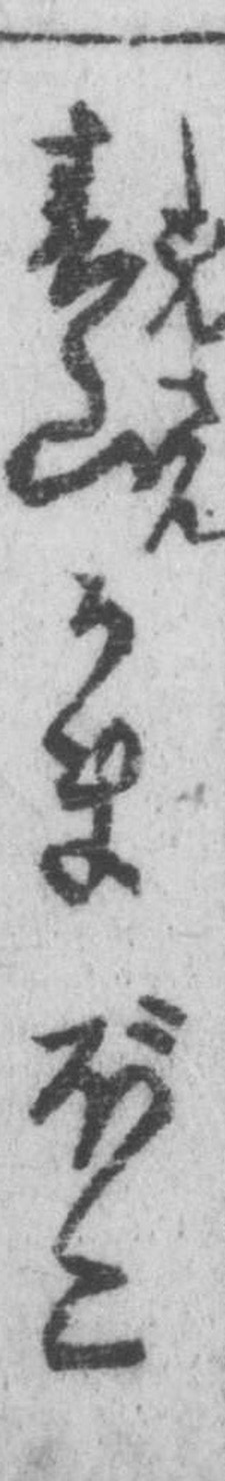春山かまぼこ

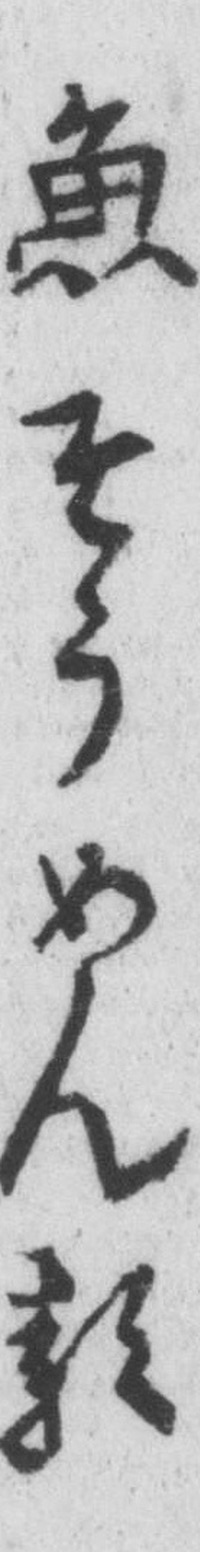魚そうめん部
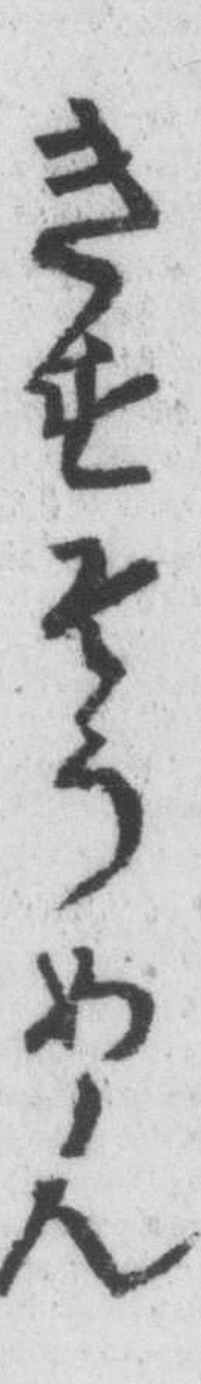海老そうめん
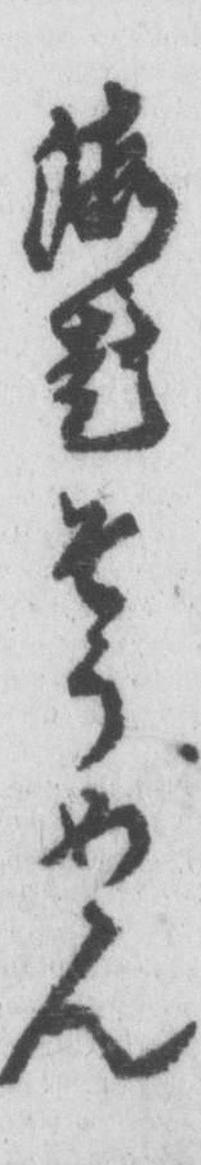海老そうめん
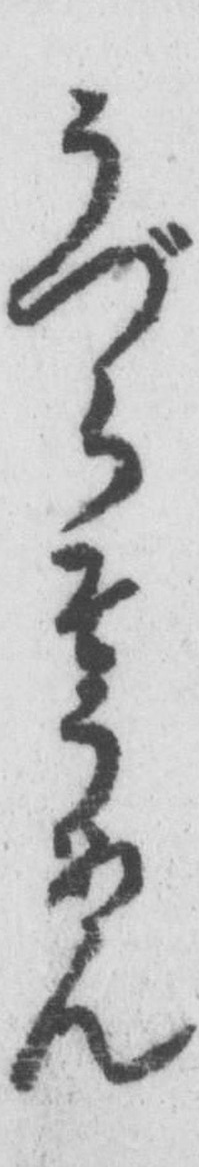うづらそうめん
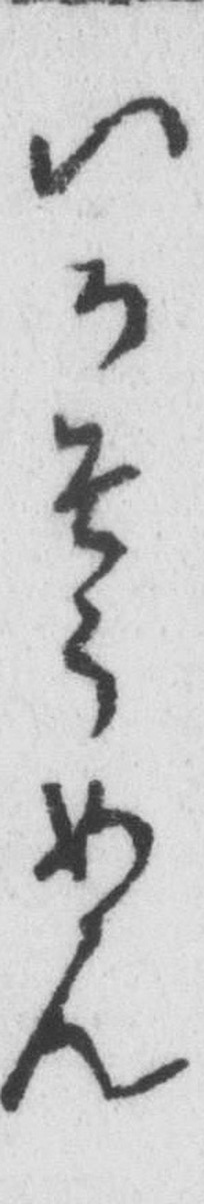海老そうめん
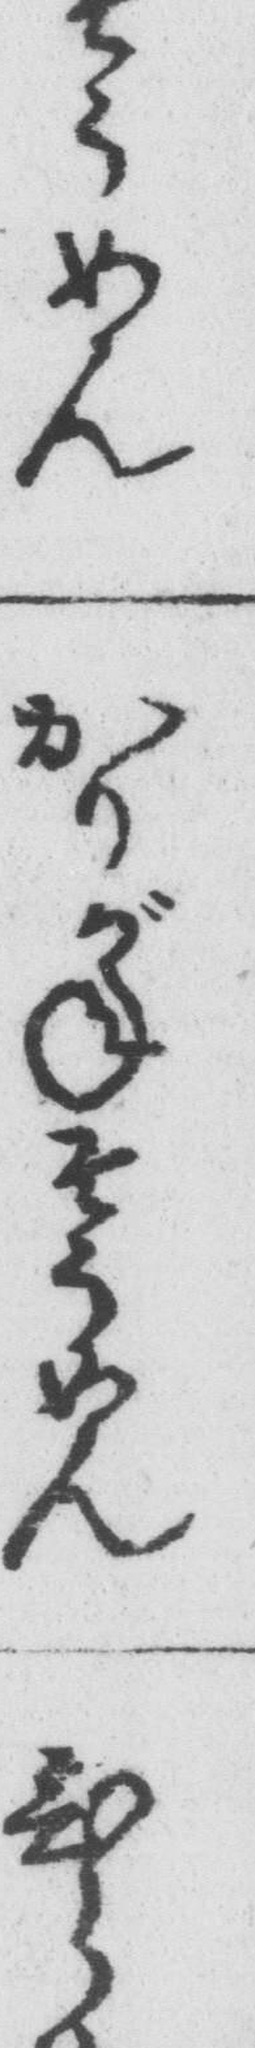いかそうめんかりがねそうめん
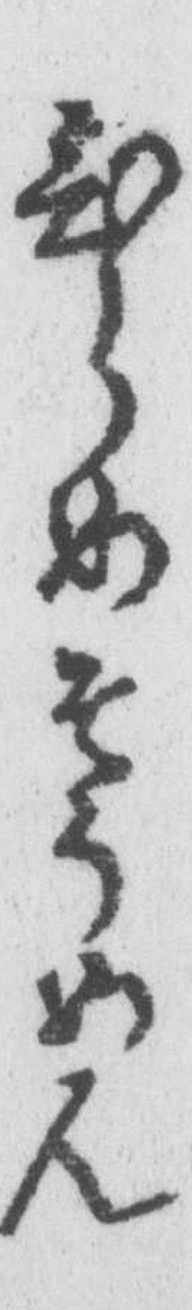ひらめそうめん
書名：当世料理献立
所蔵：大阪府立大学学術情報センター 国文学研究資料館
